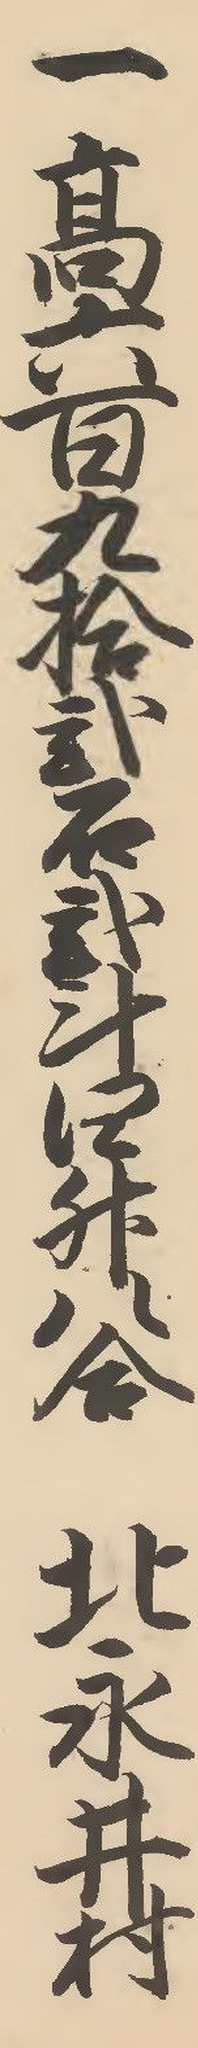一高六百九拾弐石弐斗四升八合北永井村
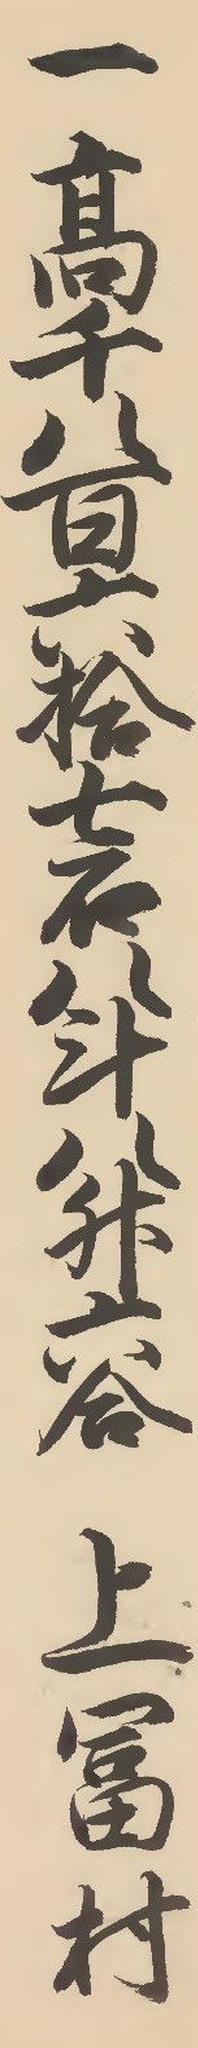一高千八百六拾七石八斗八升六合上富村
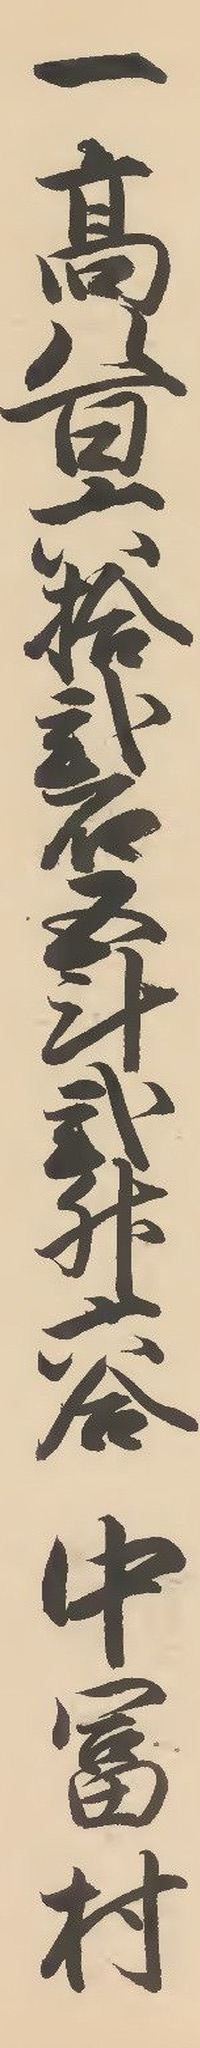一高八百六拾弐石五斗弐升六合中富村
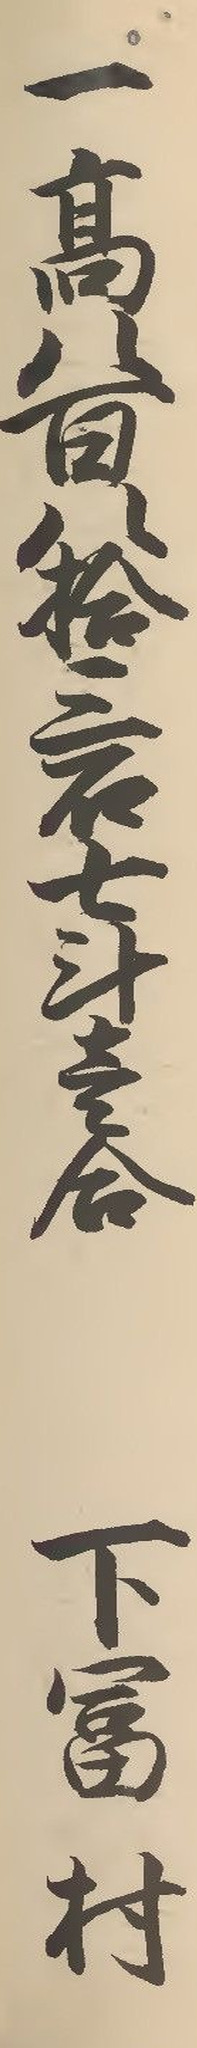一高八百八拾三石七斗壱合下富村
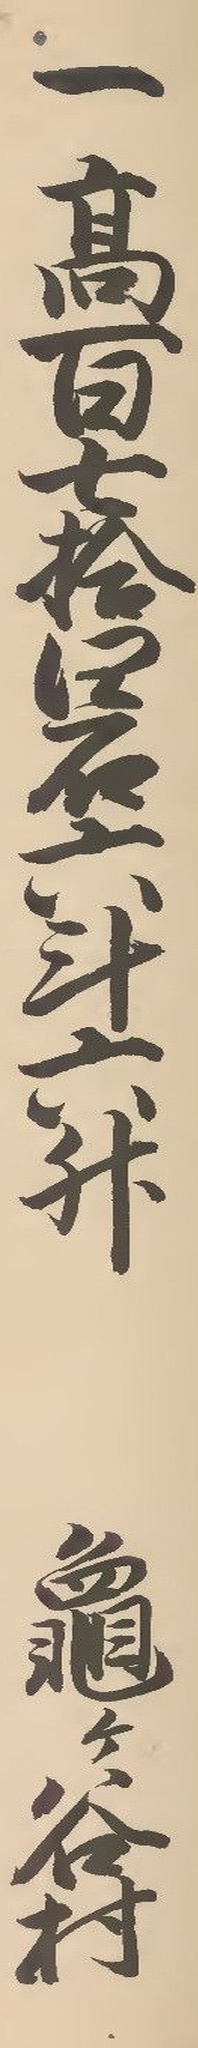一高百七拾四石六斗六升亀ヶ谷村
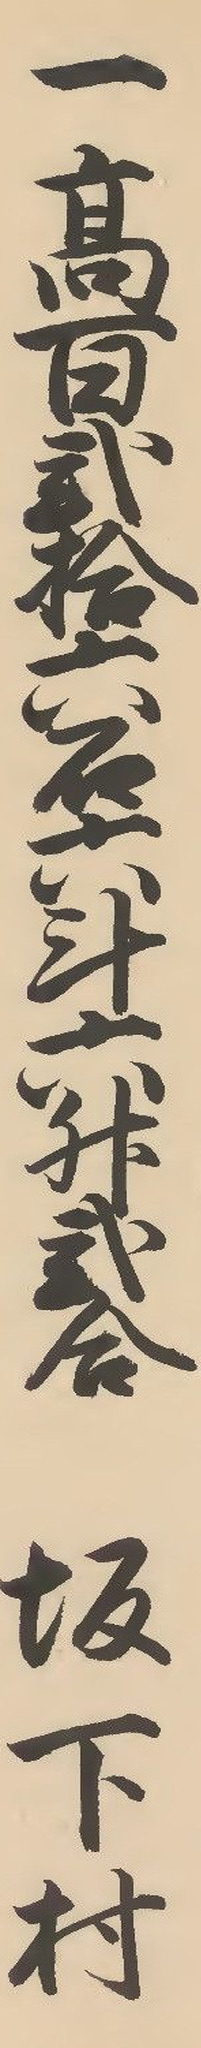一高百弐拾六石六斗六升弐合坂下村
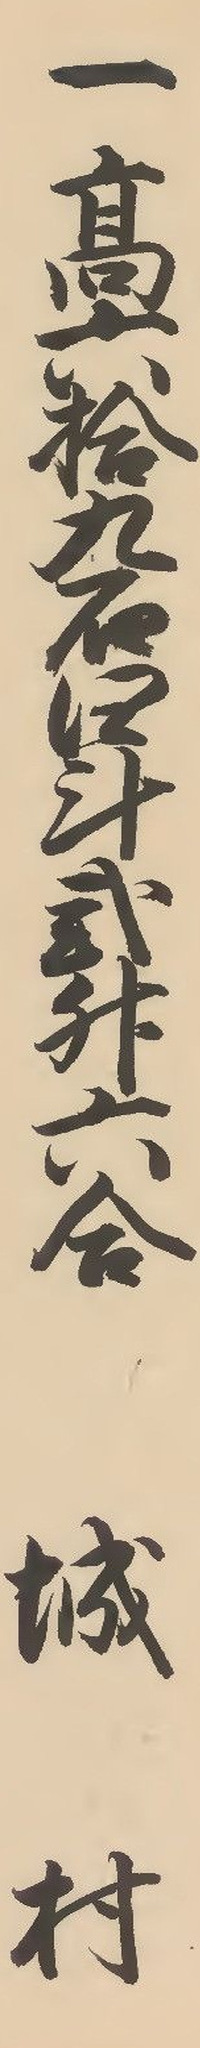一高六拾九石四斗弐升六合城村
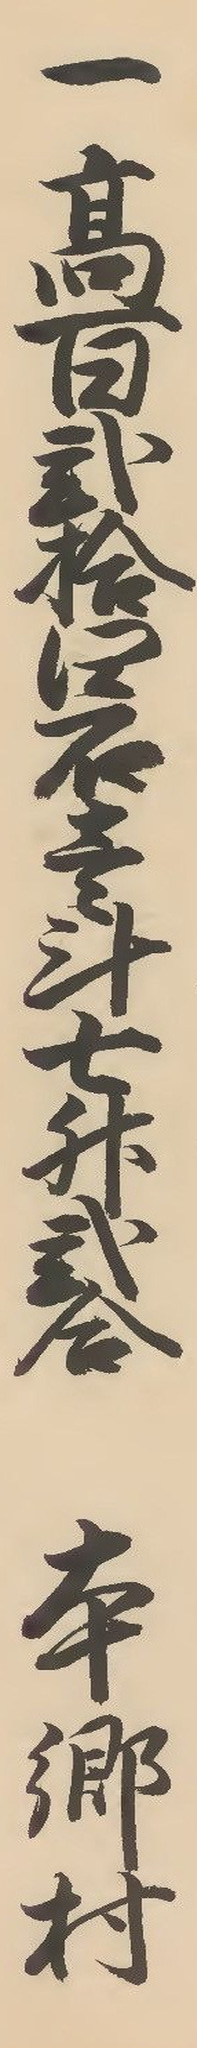一高百弐拾四石壱斗七升弐合本郷村

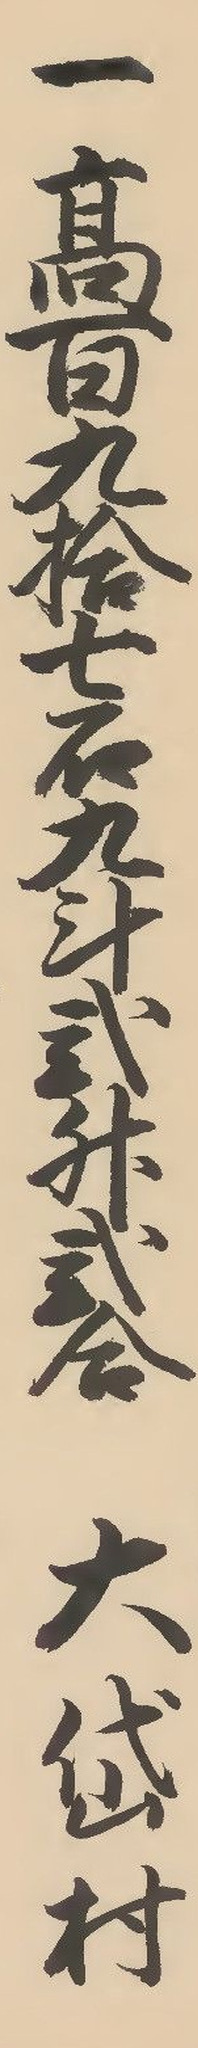一高百九拾七石九斗弐升弐合大袋村
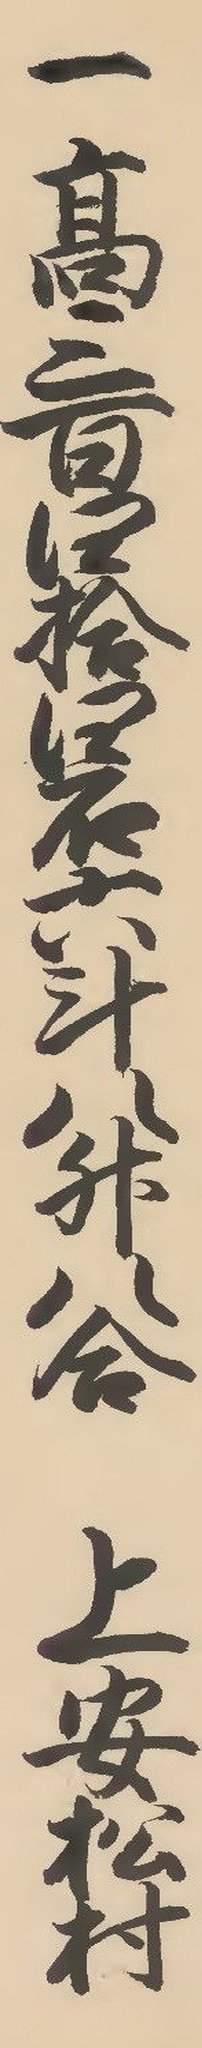一高三百四拾四石六斗八升八合上安松村
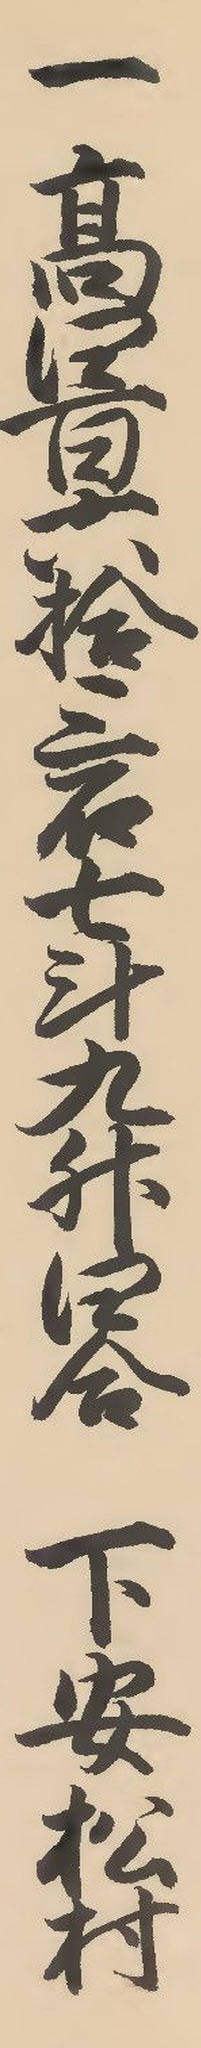一高四百六拾三石七斗九升四合下安松村
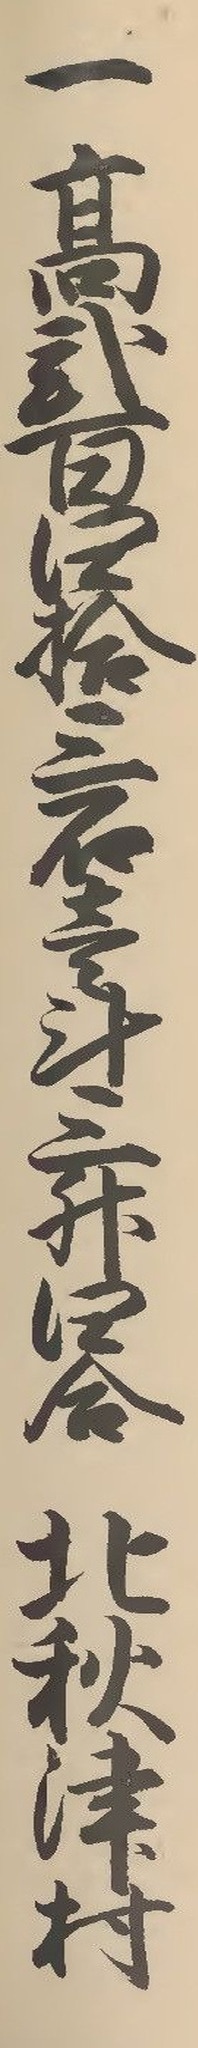一高弐百四拾三石壱斗三升四合北秋津村
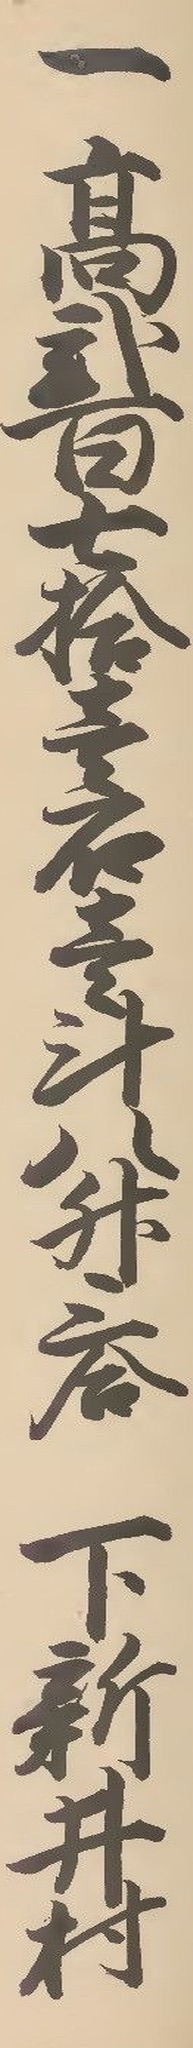一高弐百七拾壱石壱斗八升三合下新井村
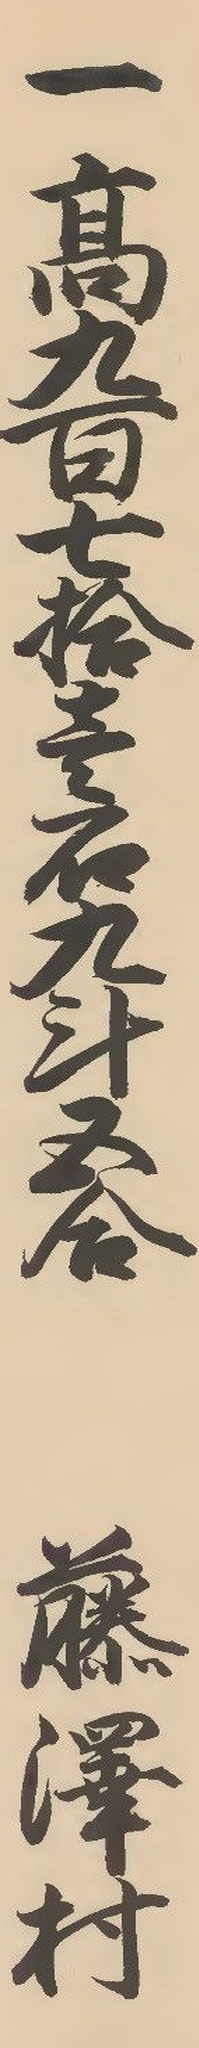一高九百七拾壱石九斗五合藤澤村
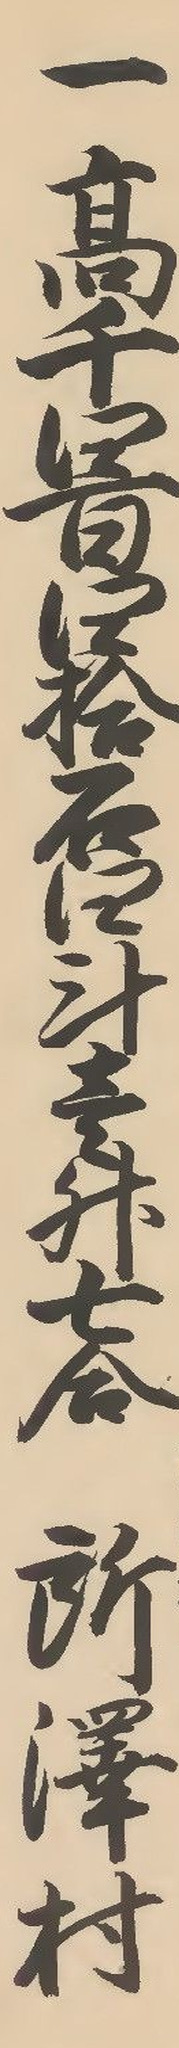一高千四百四拾石四斗壱升七合所澤村
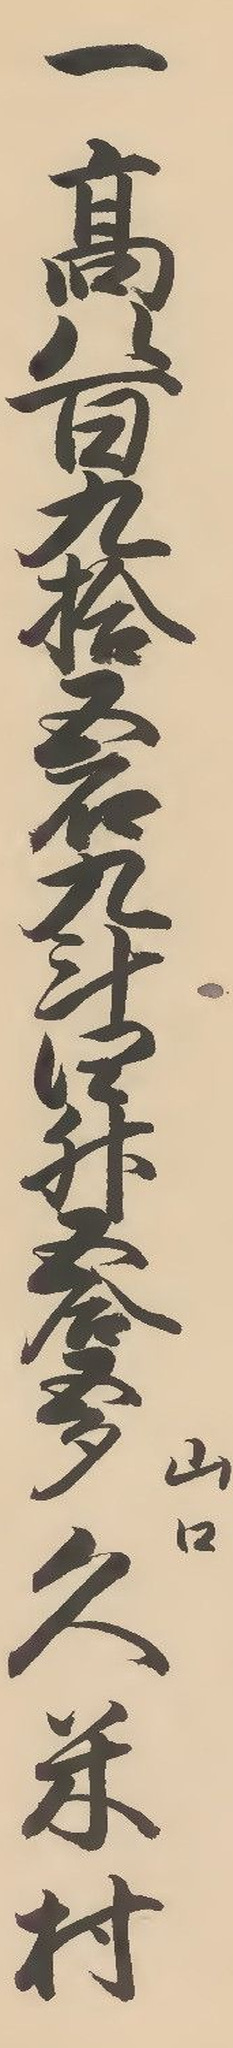一高八百九拾五石九斗四升五合五勺久米村
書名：武蔵国郷帳　上
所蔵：国立公文書館 National Archives of Japan
